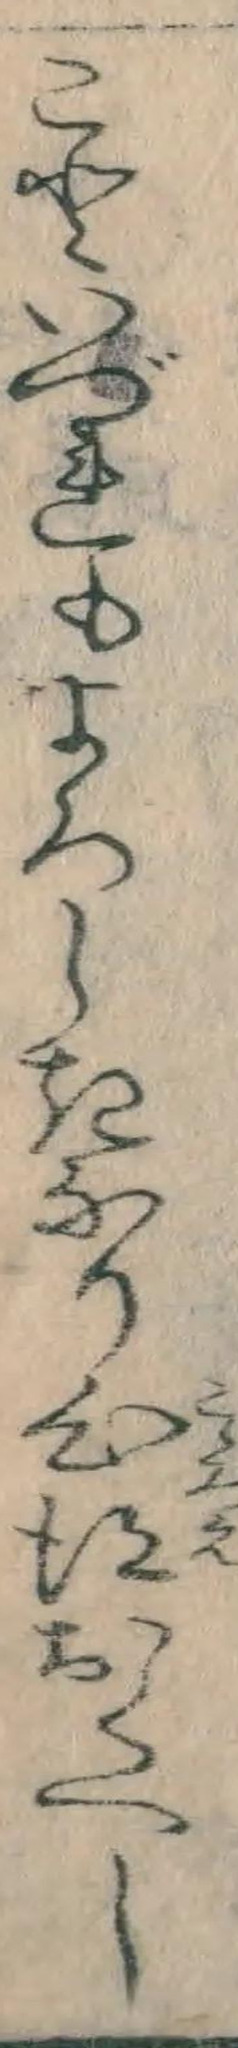こといづれもよろしきなり心得おくへし

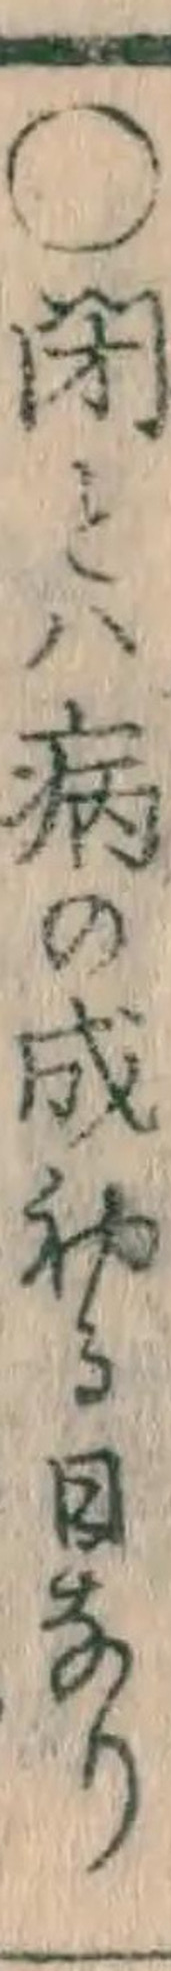○閉とは病の成初る日なり
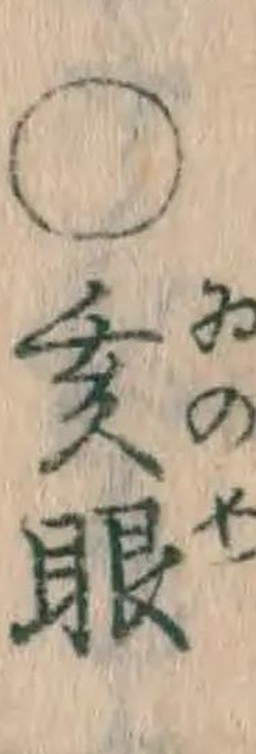○亥眼
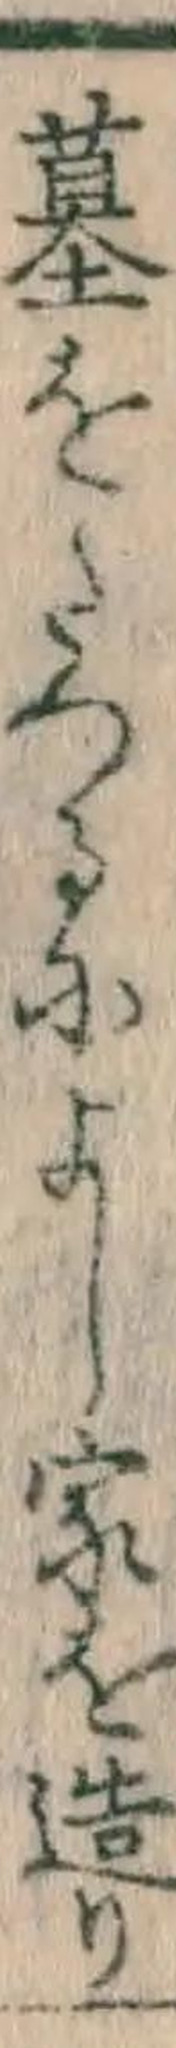墓をたつるによし家を造り
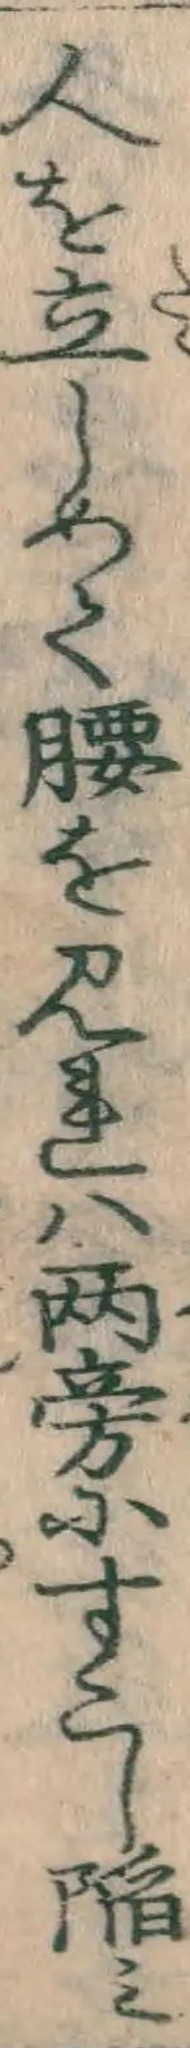人を立しめて腰を見れは両旁にすこし陥み
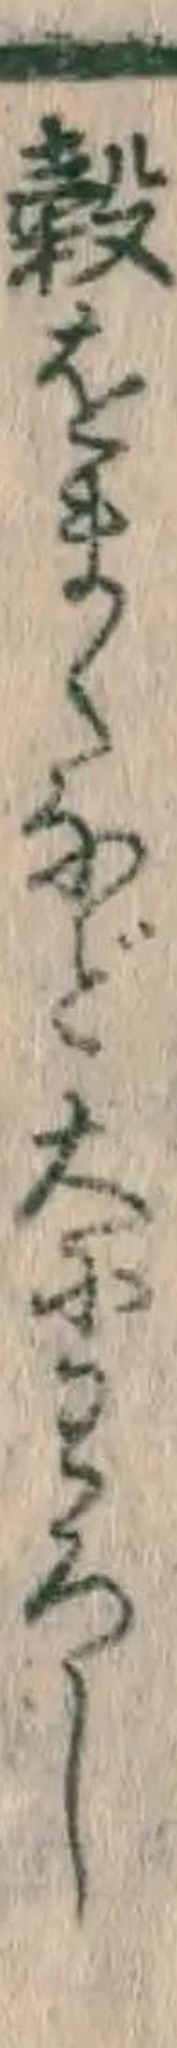穀をまくなど大にわろし
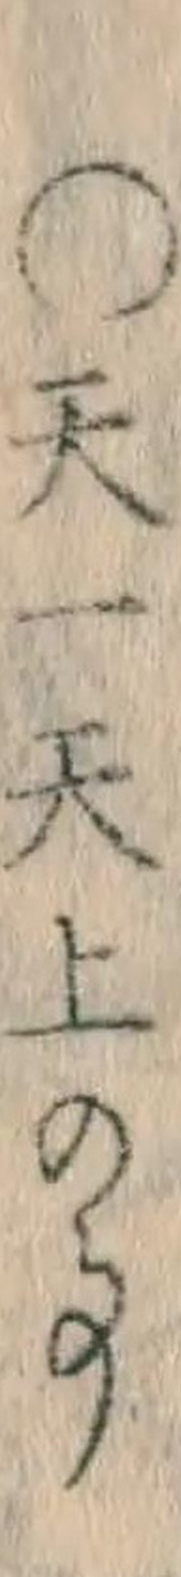○天一天上の事
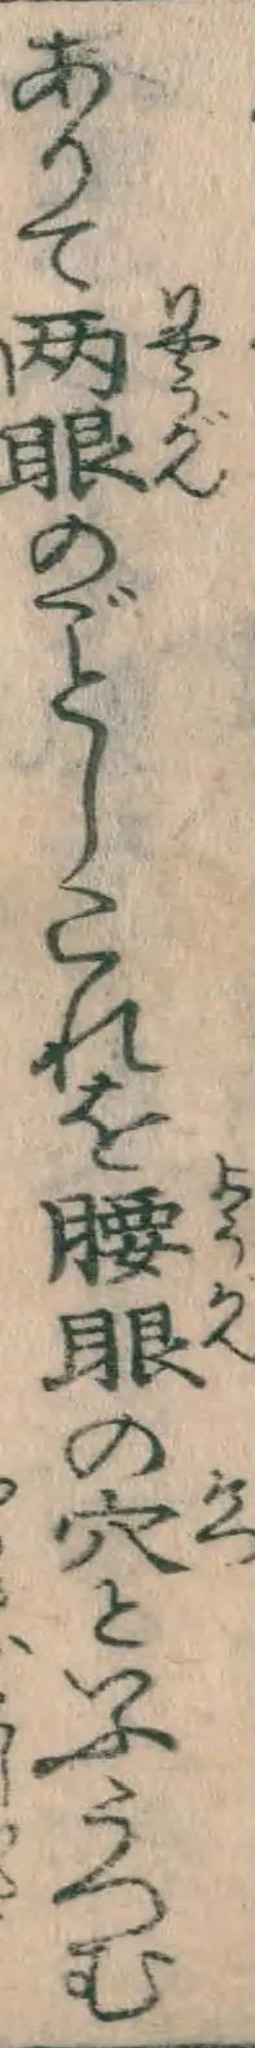ありて両眼のごとしこれを腰眼の穴といふうつむ
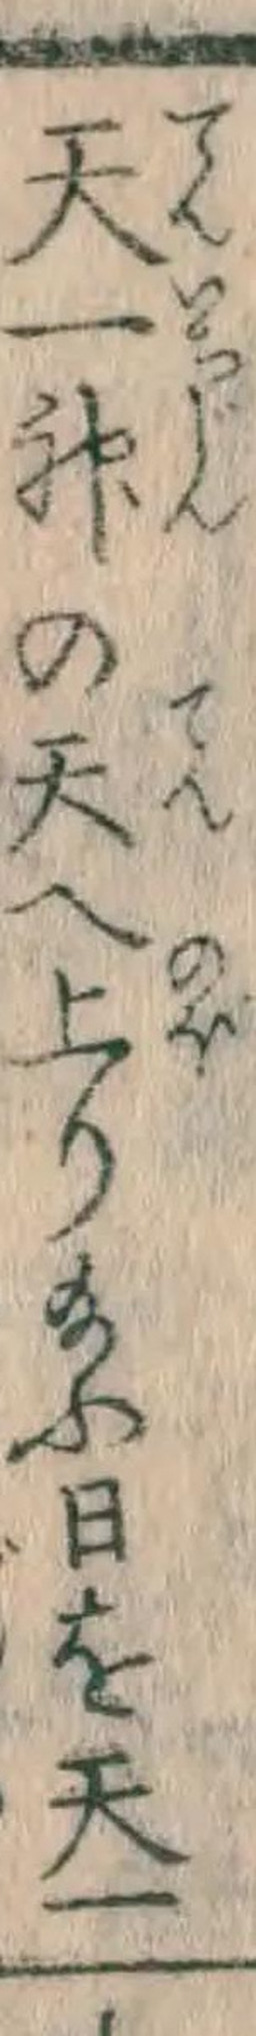天一神の天へ上り給ふ日を天一
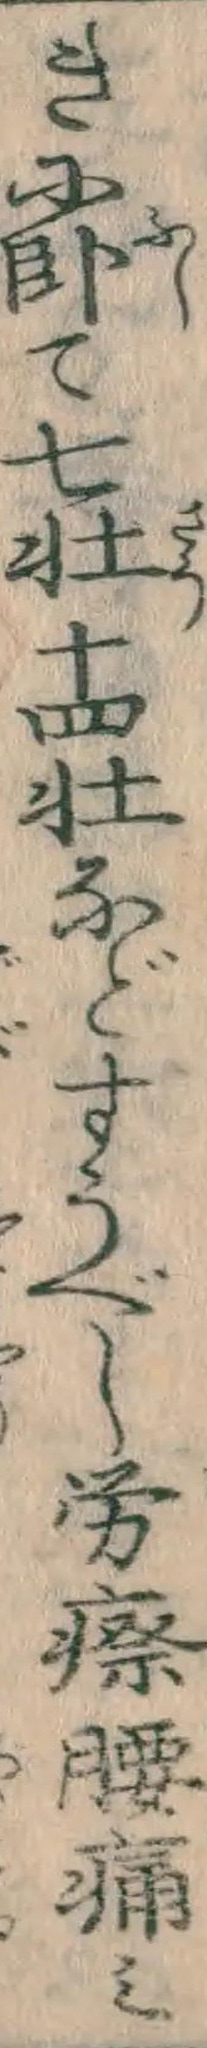きに臥て七壮十四壮などすうべし労瘵腰痛み
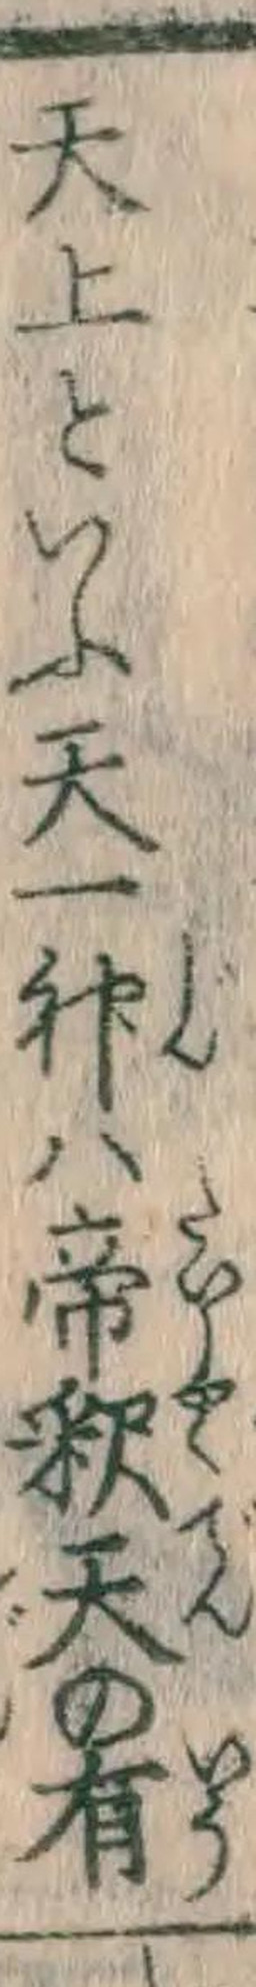天上といふ天一神は帝釈天の有
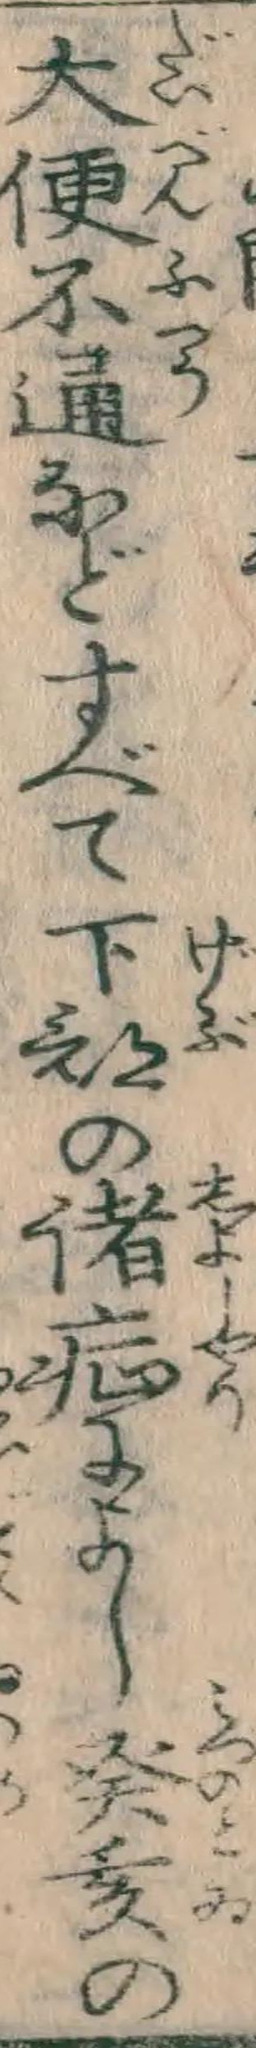大便不通などすべて下部の諸症によし癸亥の
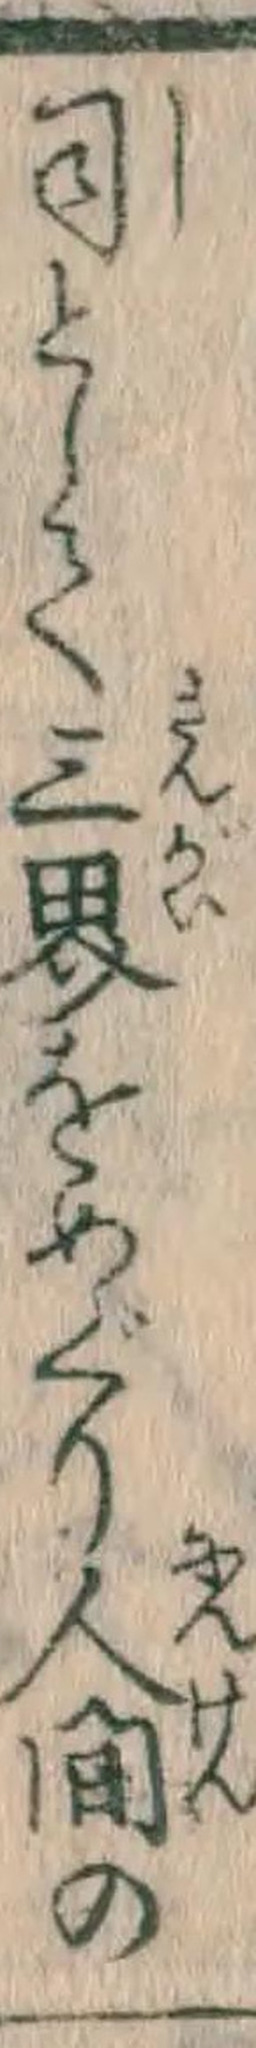司として三界をめぐり人間の
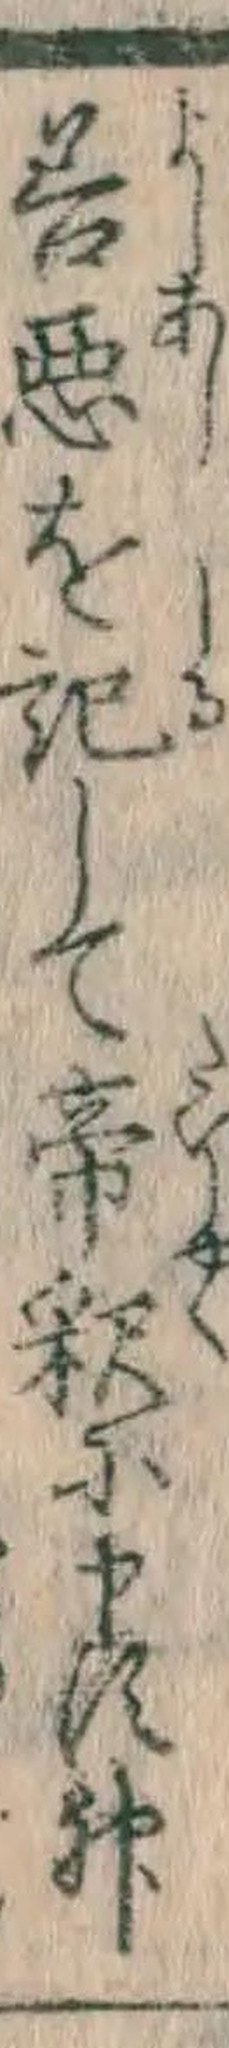善悪を記して帝釈に申す神
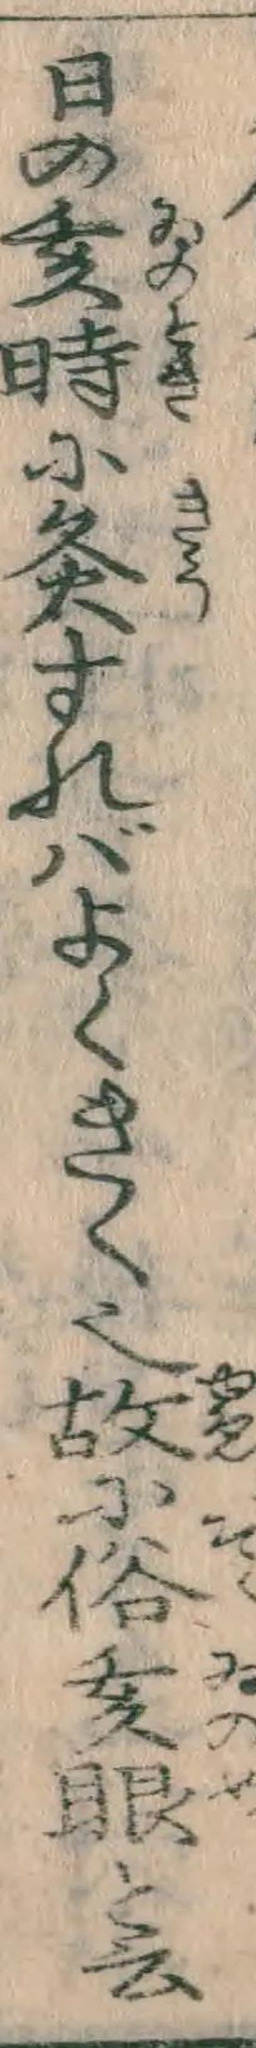日の亥時に灸すればよくきく也故に俗亥眼と云
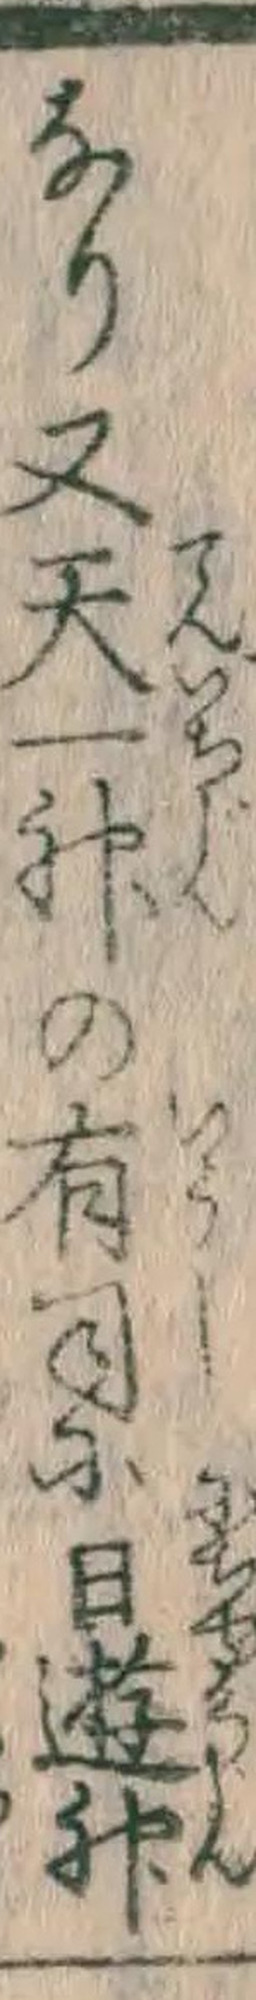なり又天一神の有司に日遊神
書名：広益秘事大全 3巻. [4]
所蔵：国立国会図書館 National Diet Library, JAPAN
